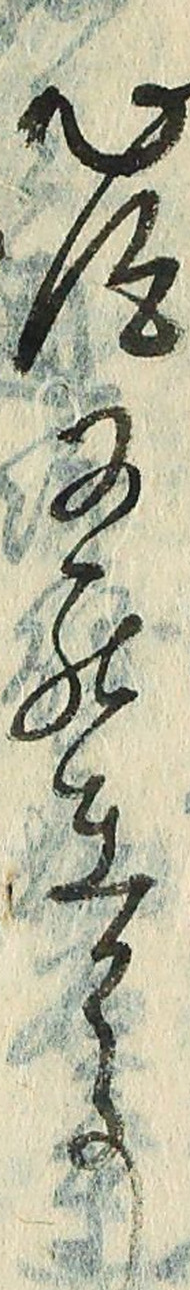心得可罷在候事
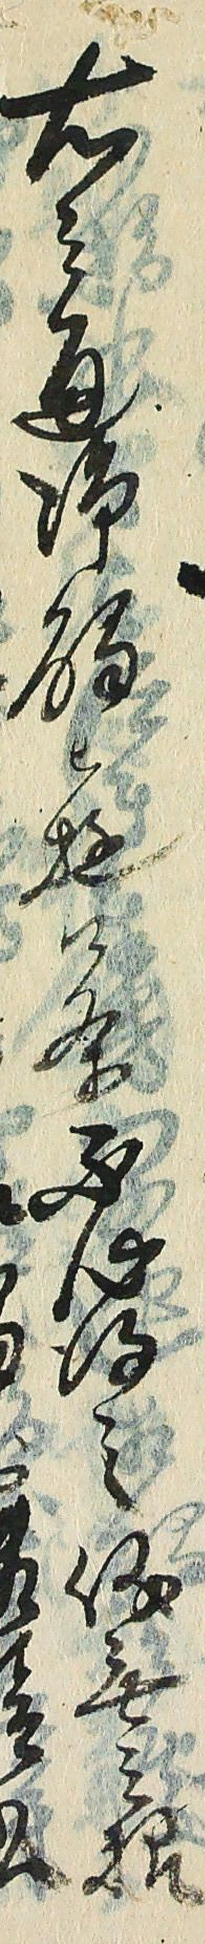右之通御触被遊候条不心得之儀無之様
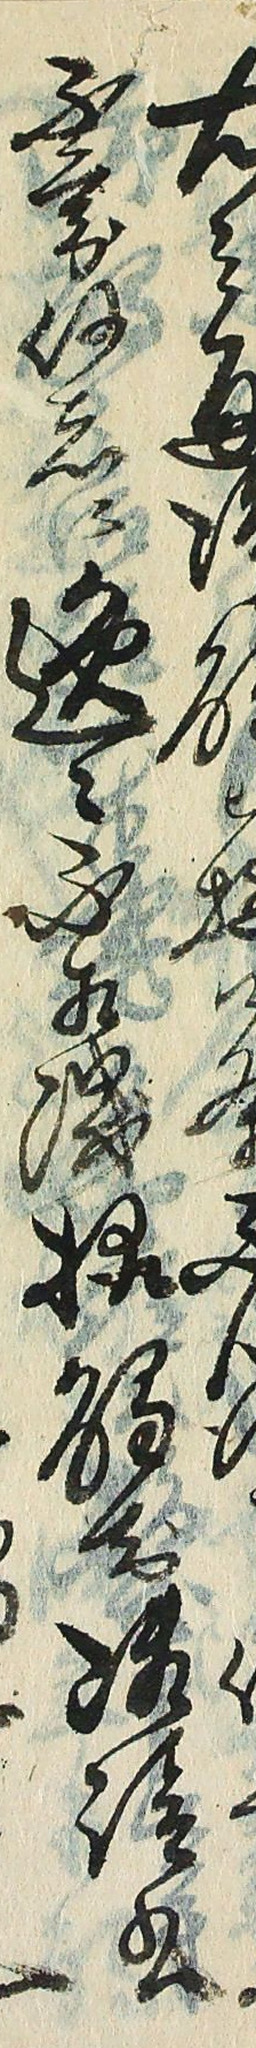不寄何者に逸々不相洩様触知御請書
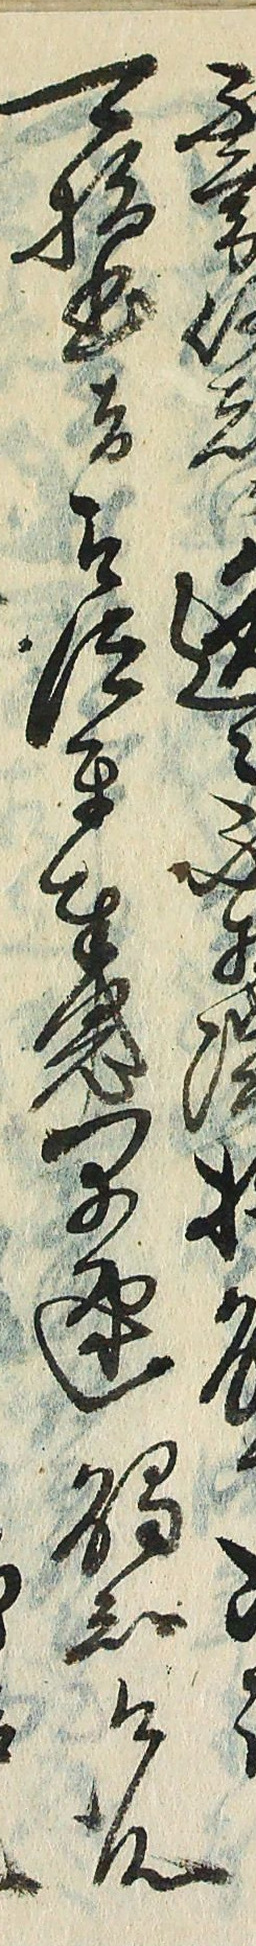可指出旨被仰付奉畏早速触知候所
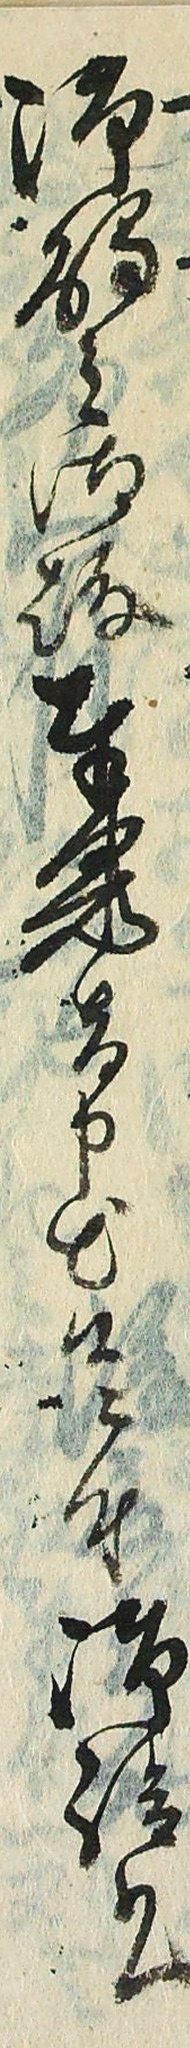御触之御趣奉畏旨申出候に付御請書
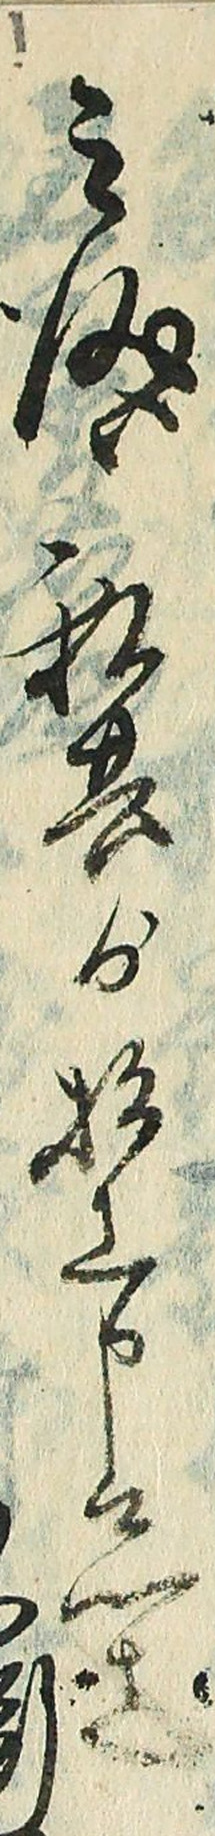之儀は私共ゟ指上申候以上
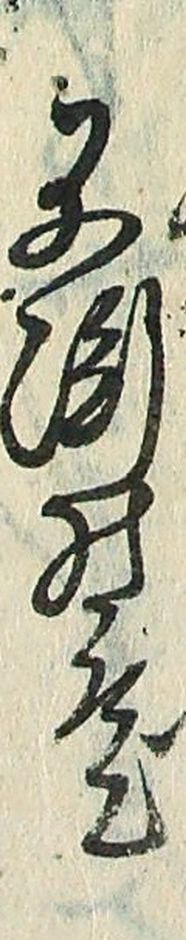早淵村庄屋
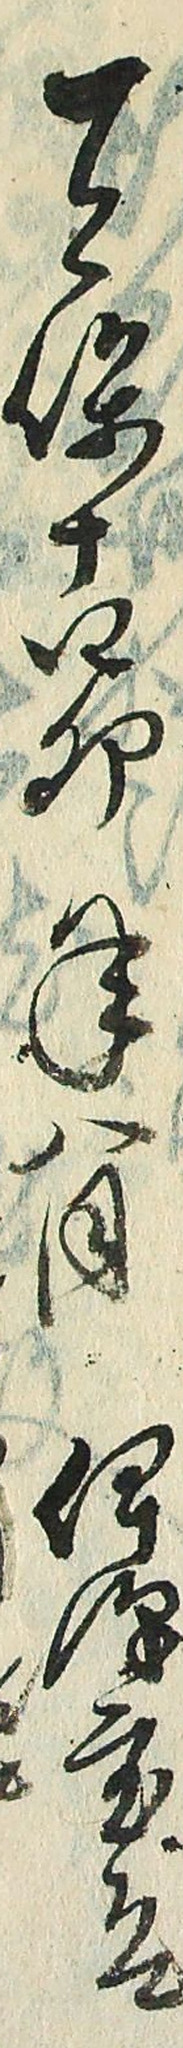天保十四卯年八月伊澤宝吉
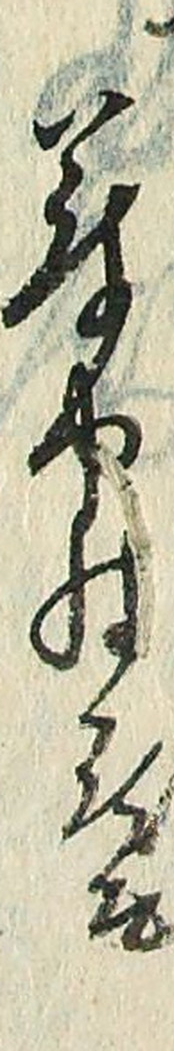府中村庄屋
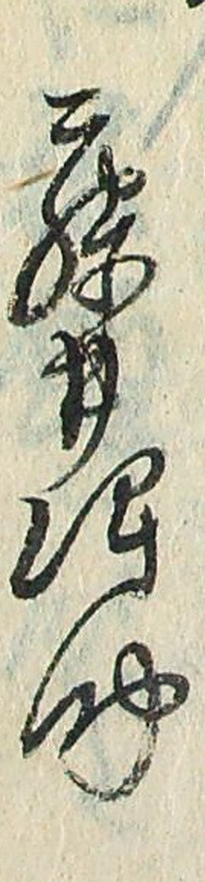藤井伊助

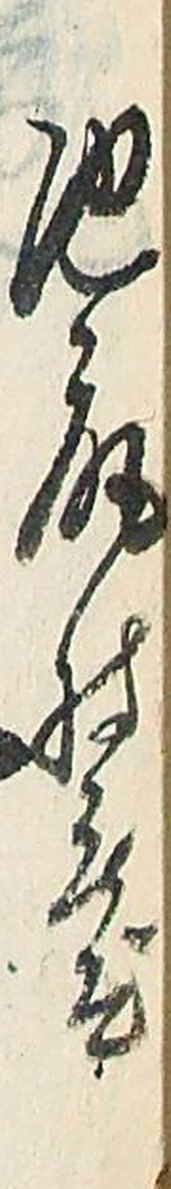池尻村庄屋
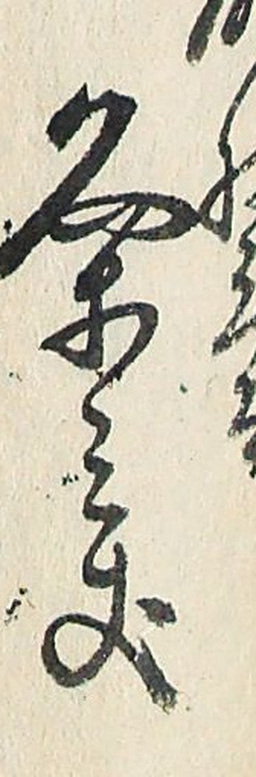粂之丈
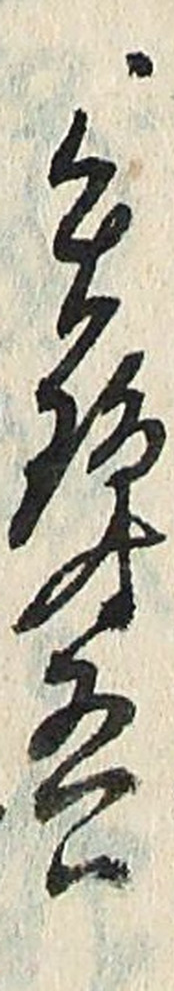矢野村右同
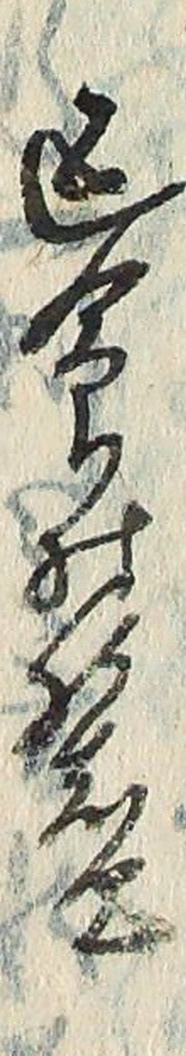延命村肝煎
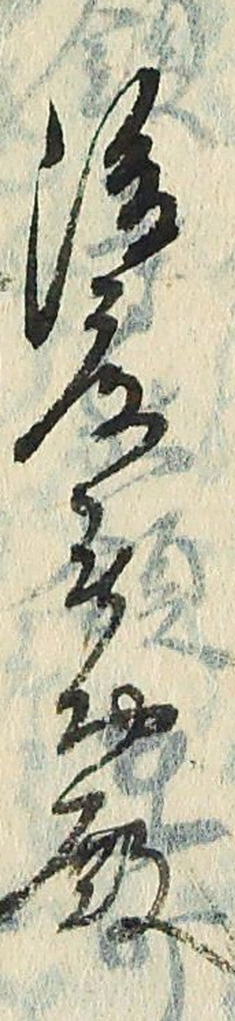後藤庄助殿
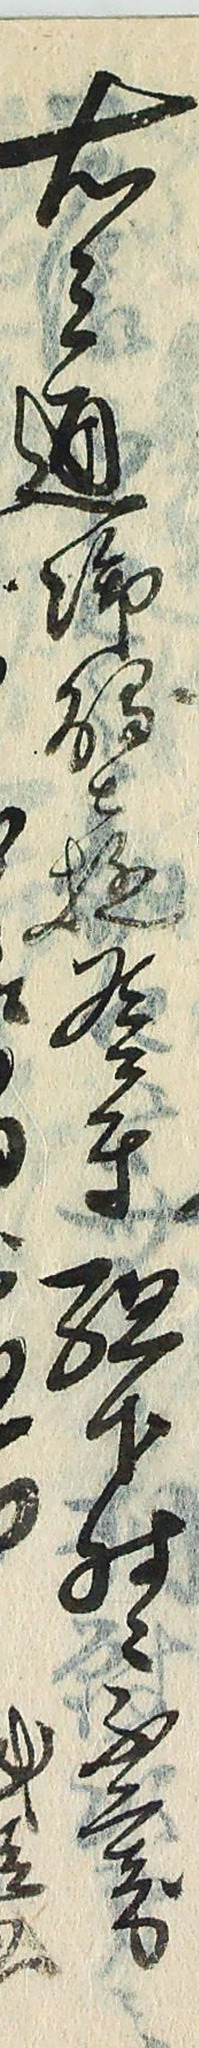右之通御触被遊候に付組下村々不寄
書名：諸御用御□受書控
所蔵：鳴門教育大学 Naruto University of Education
